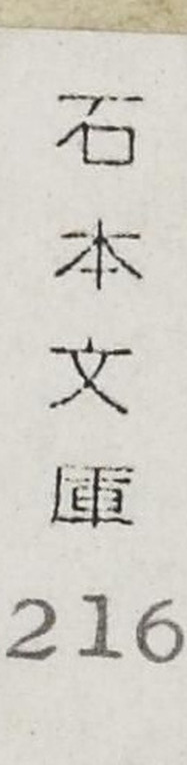石本文庫
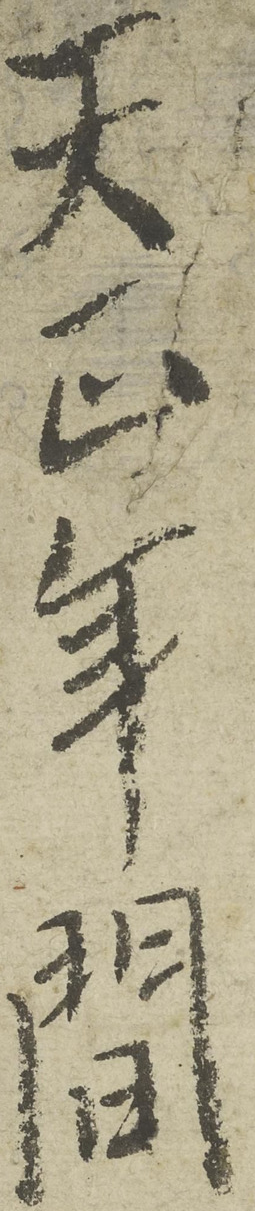天正年間
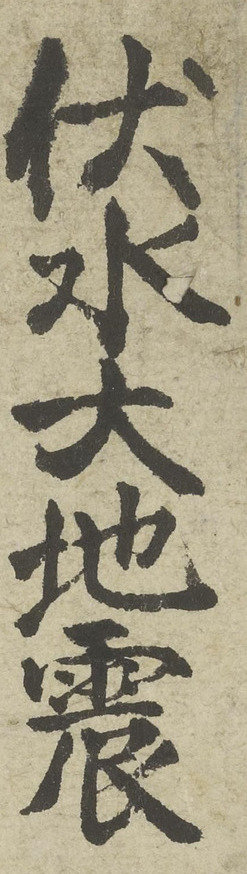伏水大地震
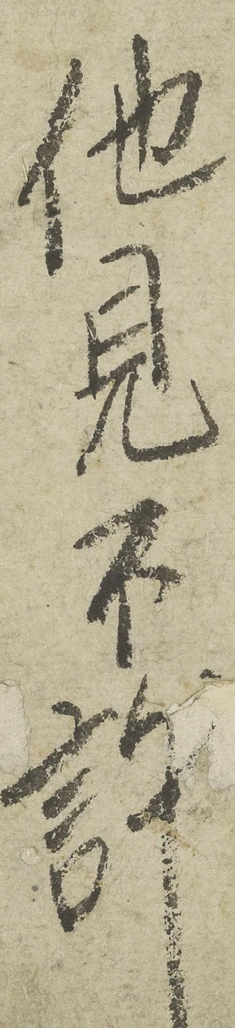他見不許

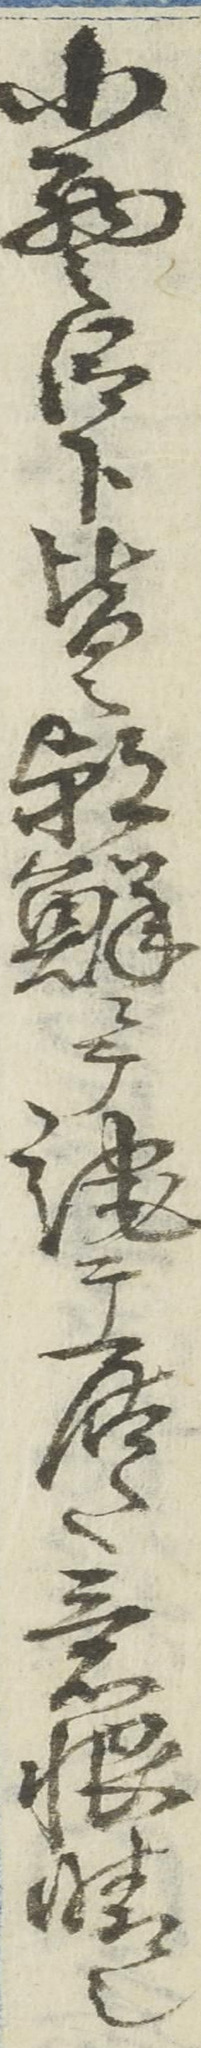小西之臣下皆々朝鮮ニテ詑テ居た意恨晴し
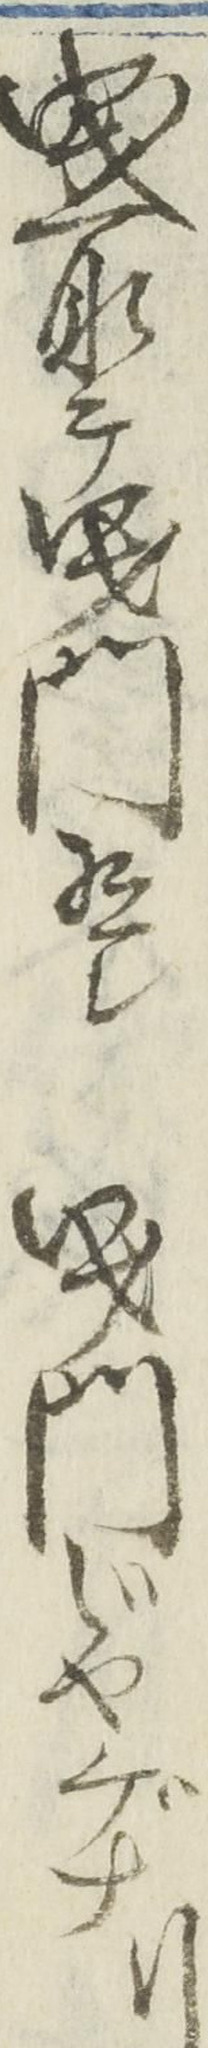曳取テ閉門有レ曳門じやげな引
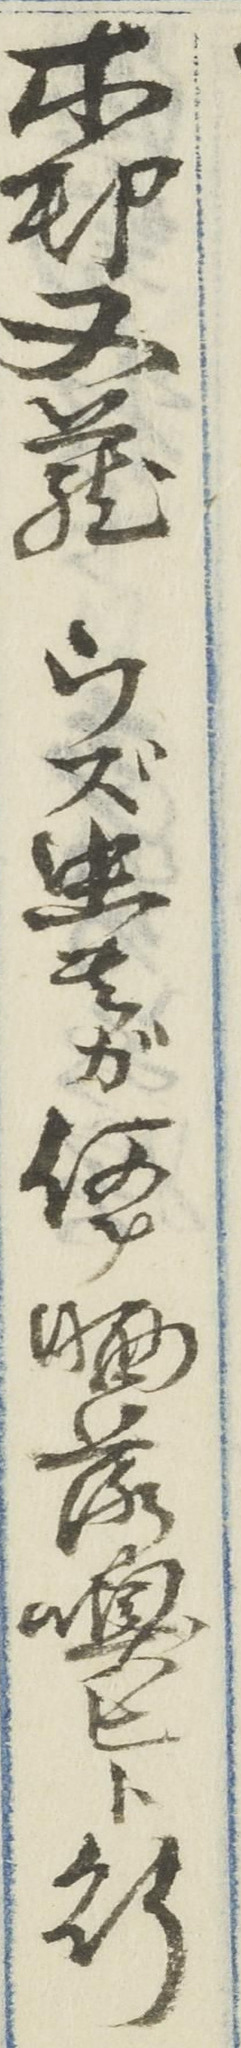木邨又蔵ウズ虫共ガ何ヲ晒落喚ヒト行
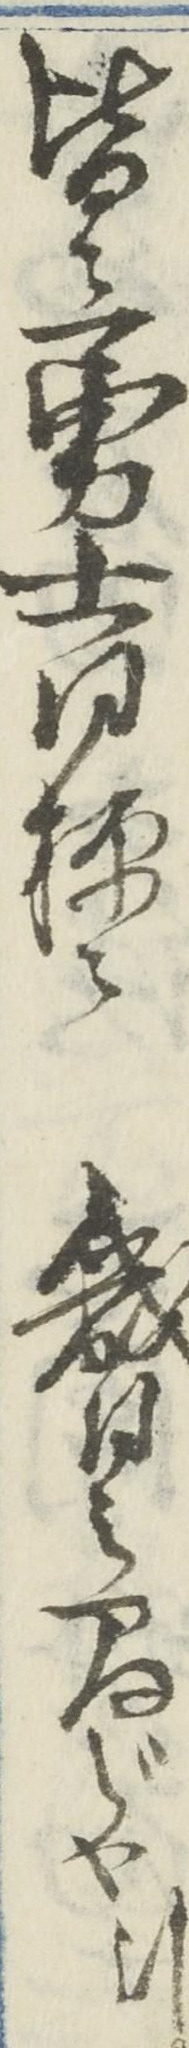皆々勇士同様ニ歳月之間じや引
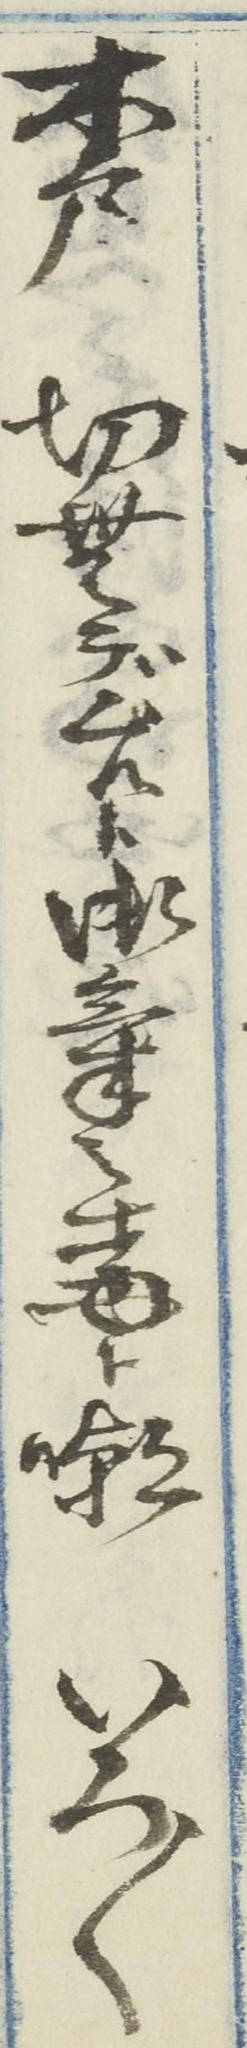木戸切無デ御座るト御氣之毒ト嘲いろ〳〵
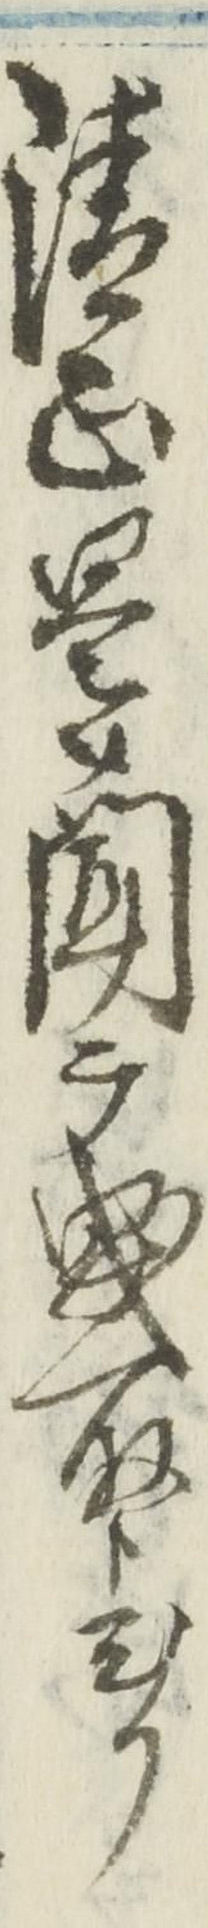清正是ヲ聞テ曳取ト云ウ
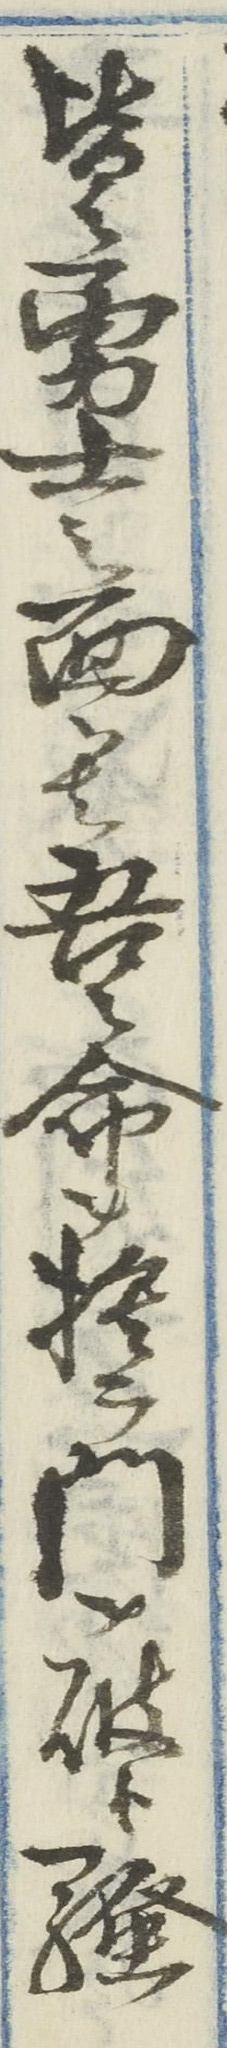皆々勇士之面々は吾ニ命ヲ捨テ門ヲ破ト騒
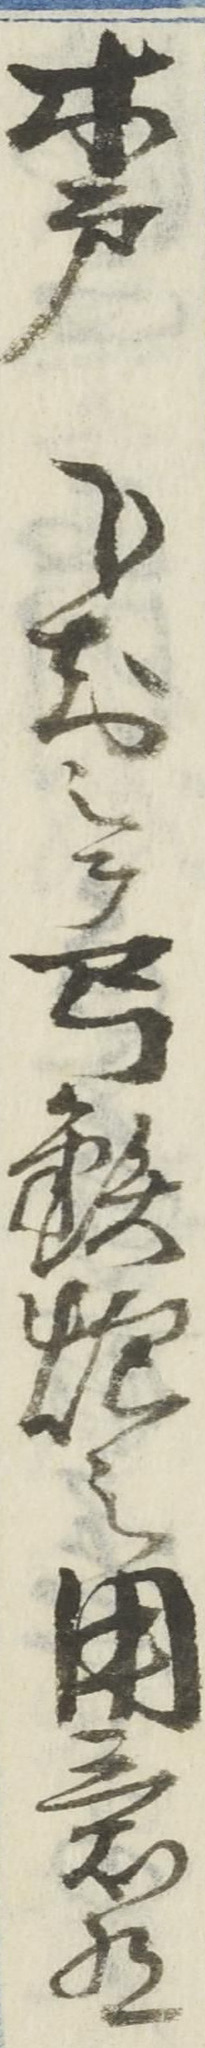木戸下知シテ弓鉄炮之用意有
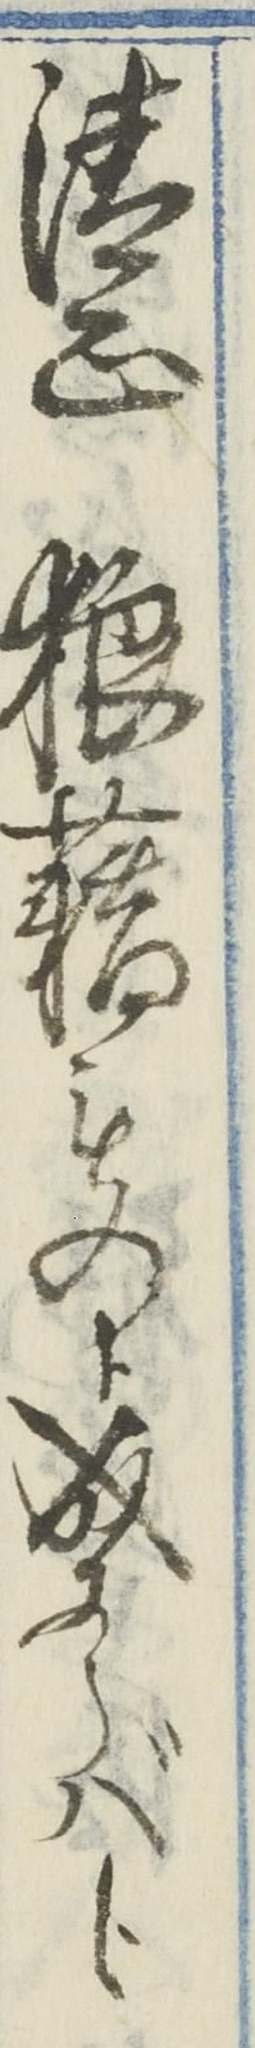清正狼藉ものト成あらバト
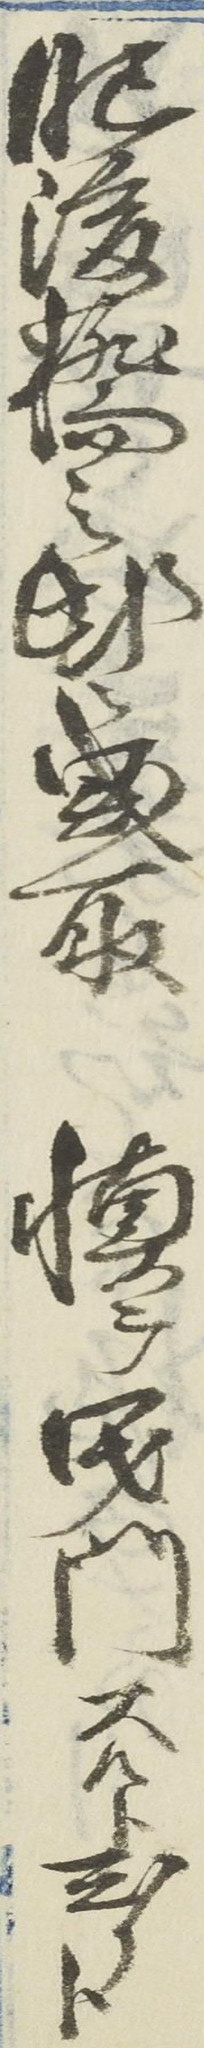肥後橋之邸二曳取慎テ閉門スルト云ウト
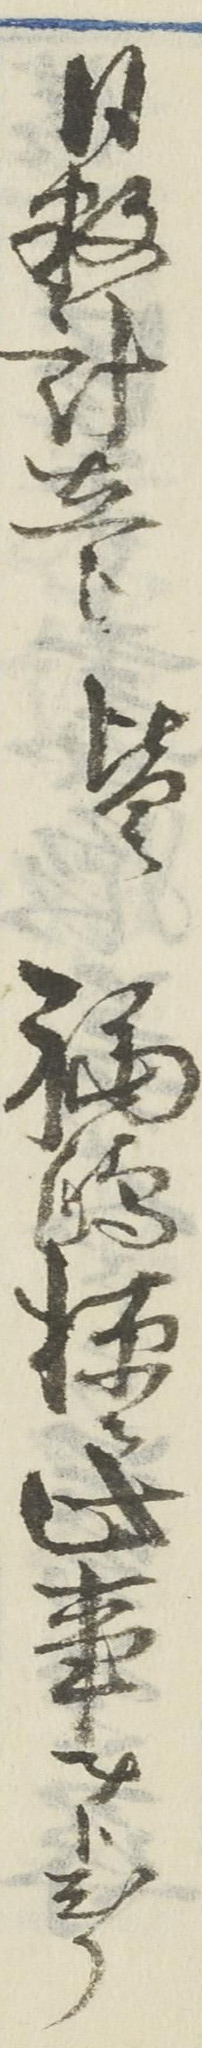日数計立ト皆々福島様ニ此事ヲト云ウ
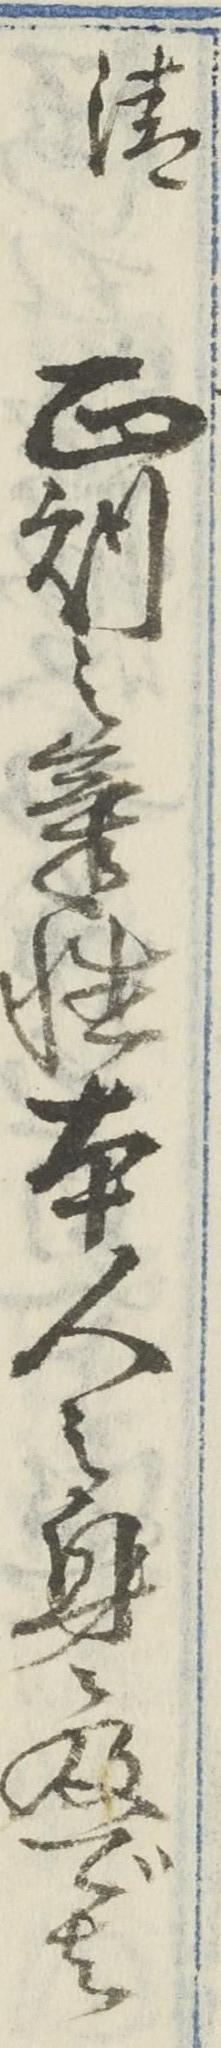清正則之気性本人之身ニ及では
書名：伏水大地震
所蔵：東京大学地震研究所図書室 Earthquake Research Institute Library, The University of Tokyo, JAPAN
